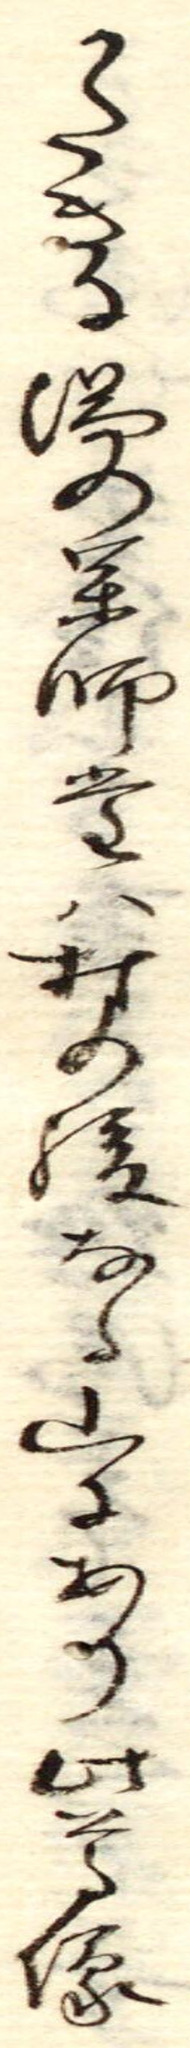かたきに湯の薬師堂は村の後なる山にあり此尊像
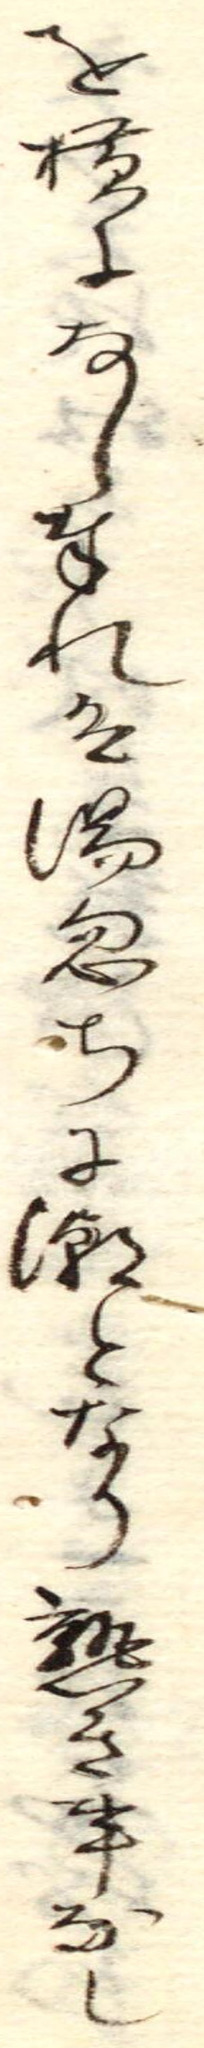を横になし奉れは湯忽ちに潮となり熟き事なし
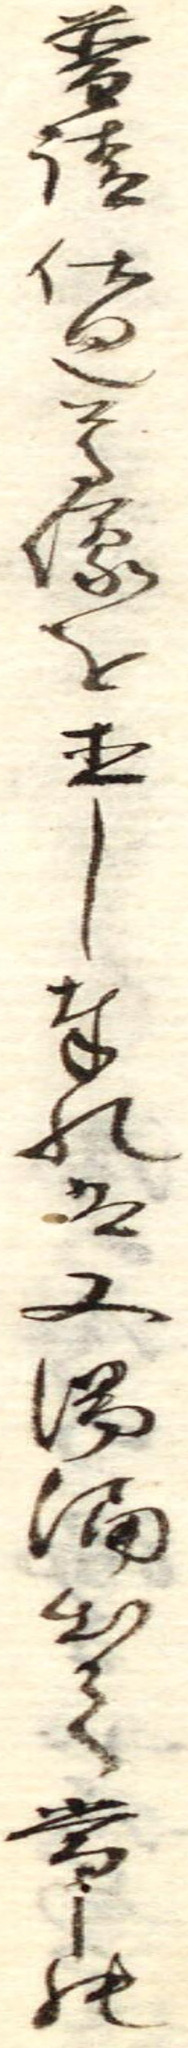普請仕廻尊像を直し奉れは又湯脇だし湧出て常の
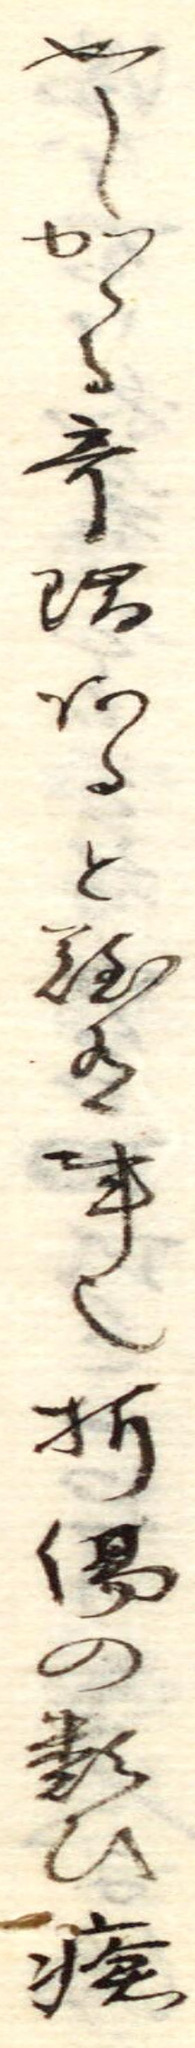如しかゝる奇瑞あると難有事也折傷の類ひ瘡
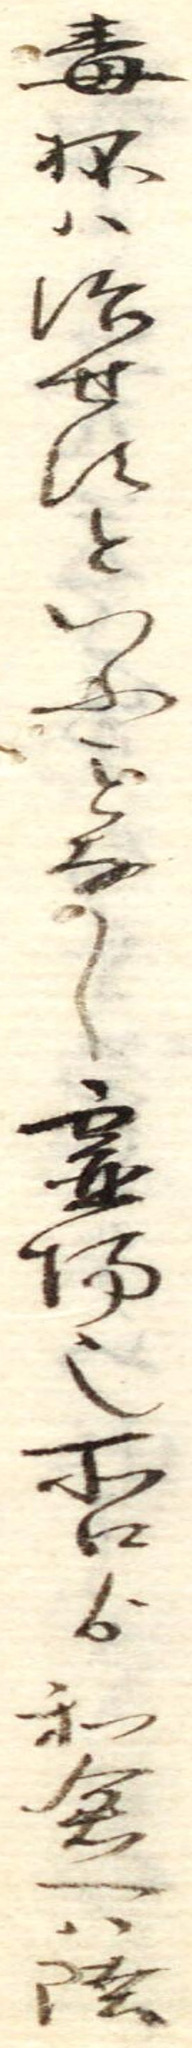毒抔は治せすといふことなし霊場也所口ゟ和倉へは陸
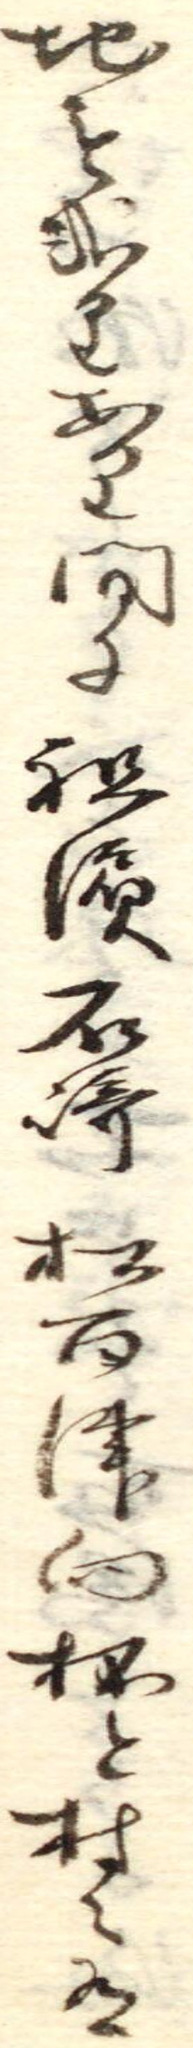地は弐里あり間に祖浜石崎松百津向抔と村々有
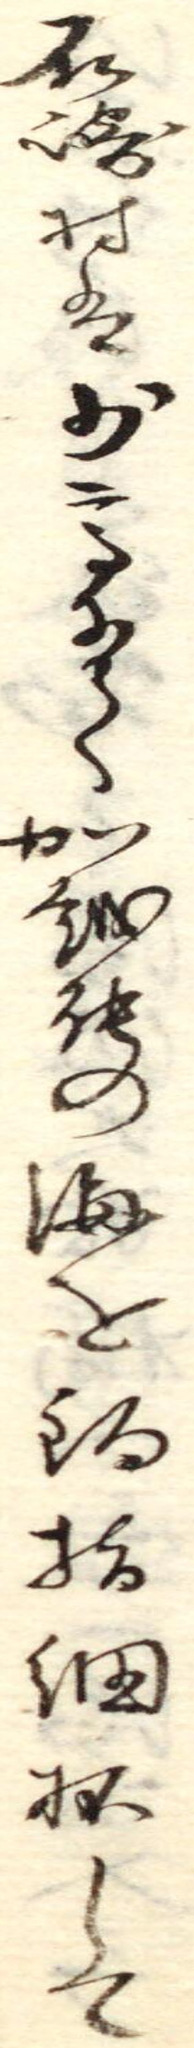石崎村は少高にて加越能の海を釣指調抔して
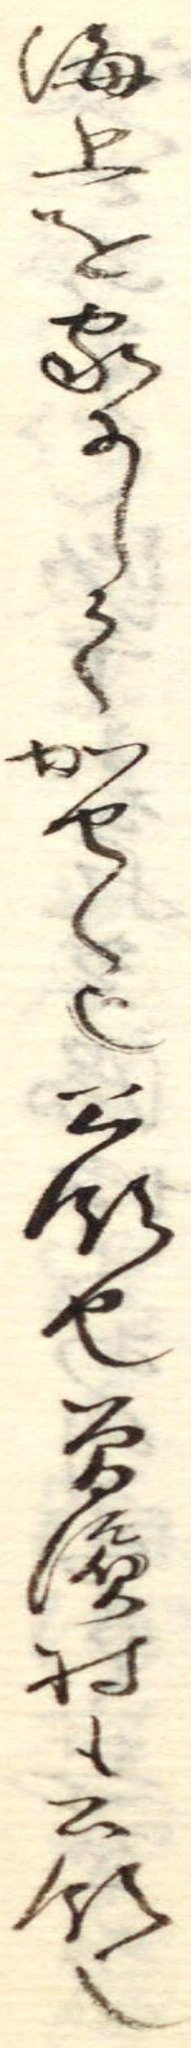海上を家にしてかせく也公領也曽浜村も公領也
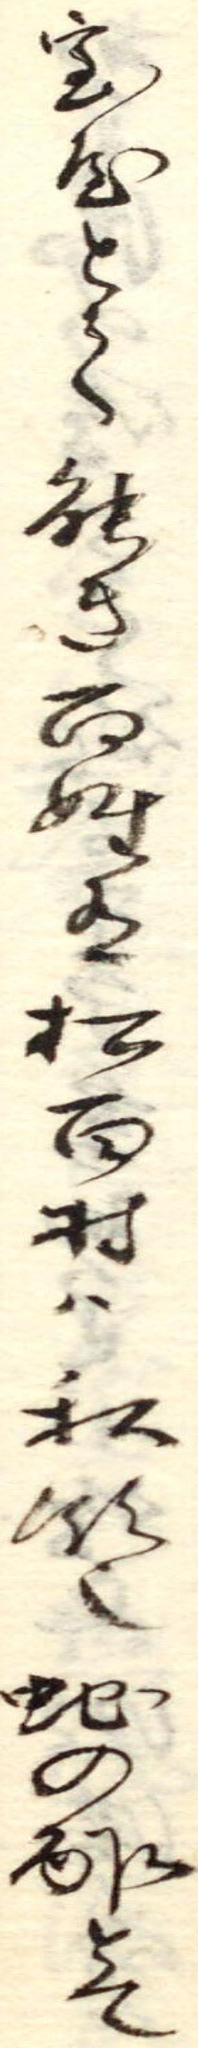宝屋とて能き百姓有松百村は私領也蛇の酢とて
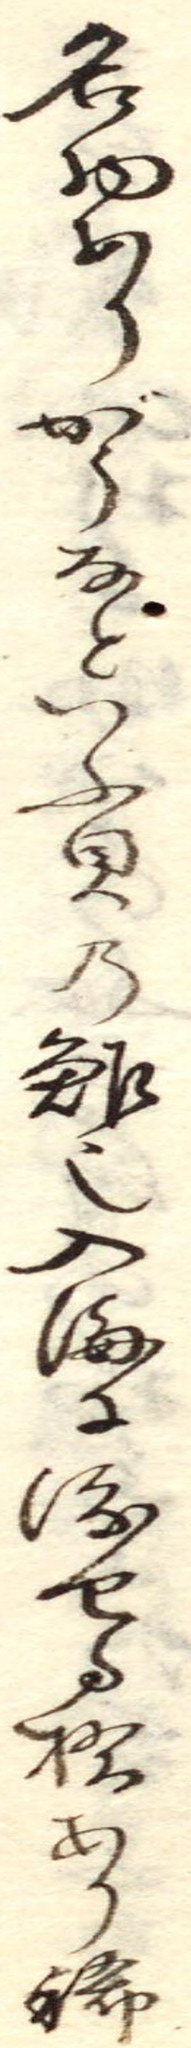名物ありがうなといふ貝の鮓也入海に渡せる橋あり稀
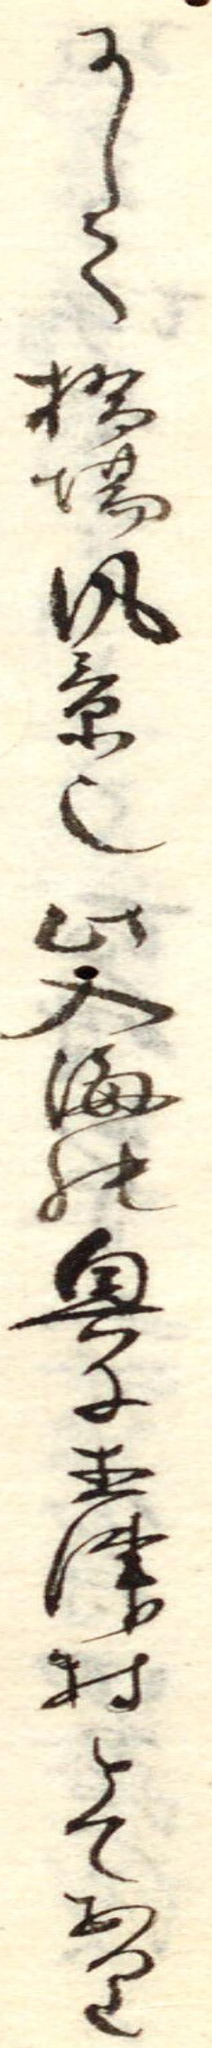にして橋場風景也此入海の奥に直津村とてあり
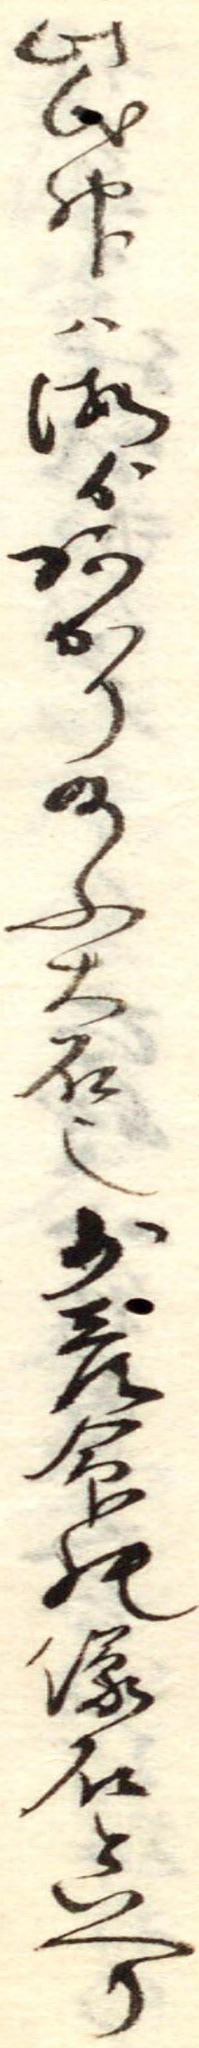此氏神は海ゟあかり給ふ大石也少彦命の像石といへり
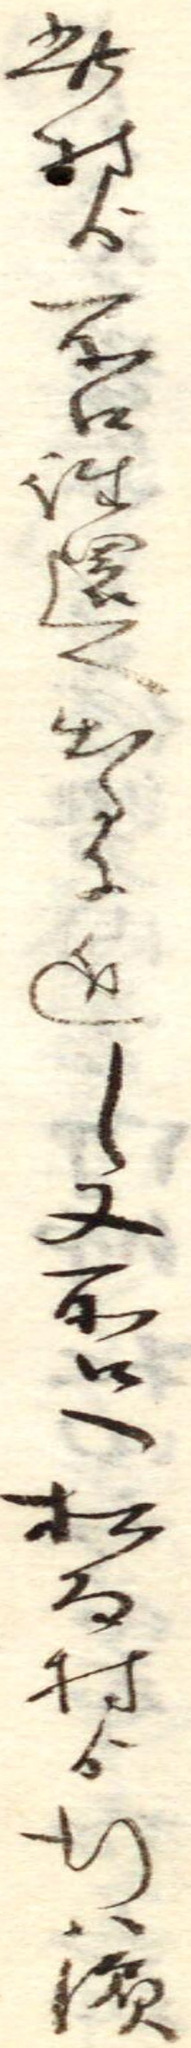此村ゟ所口往還へ出るに近し又所口へ松百村ゟ行は浜
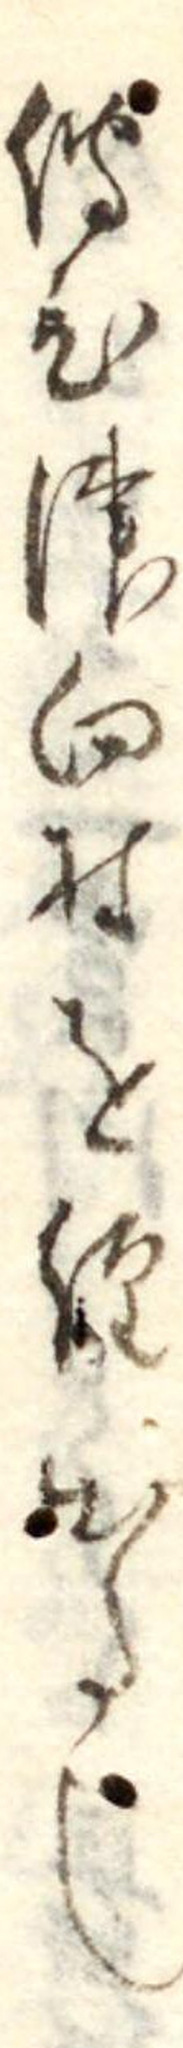伝ひ津向村を経出る也
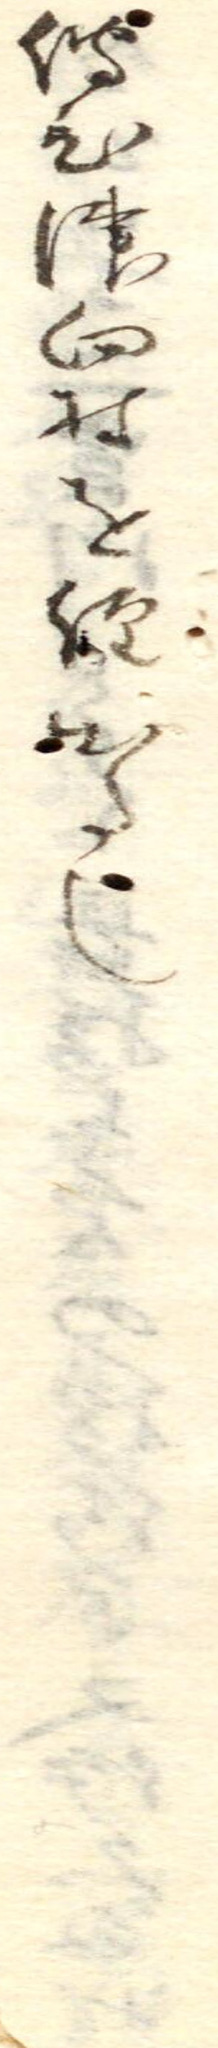伝ひ津向村を経出る也
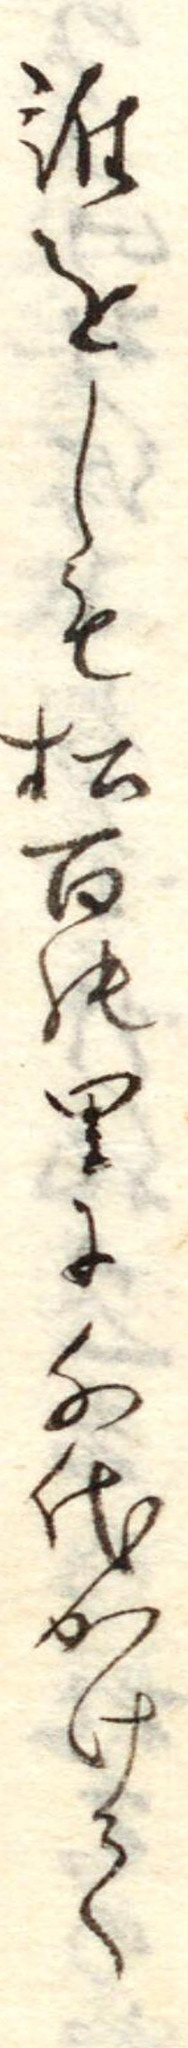誰をしも松百の里に千代かけて
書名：能登名跡誌
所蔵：Ishikawa Prefectural Library
